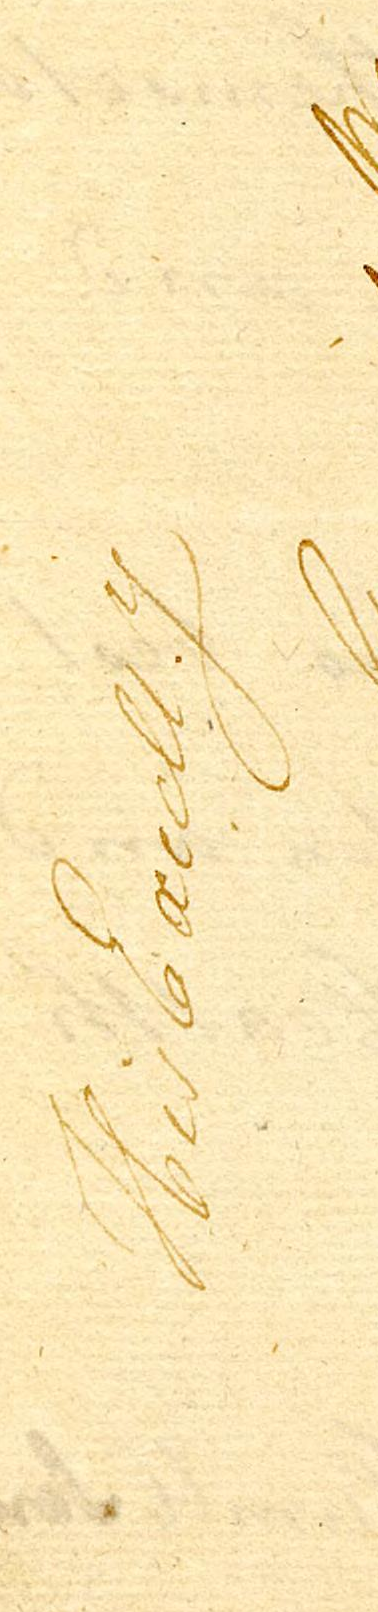His Excell^y.
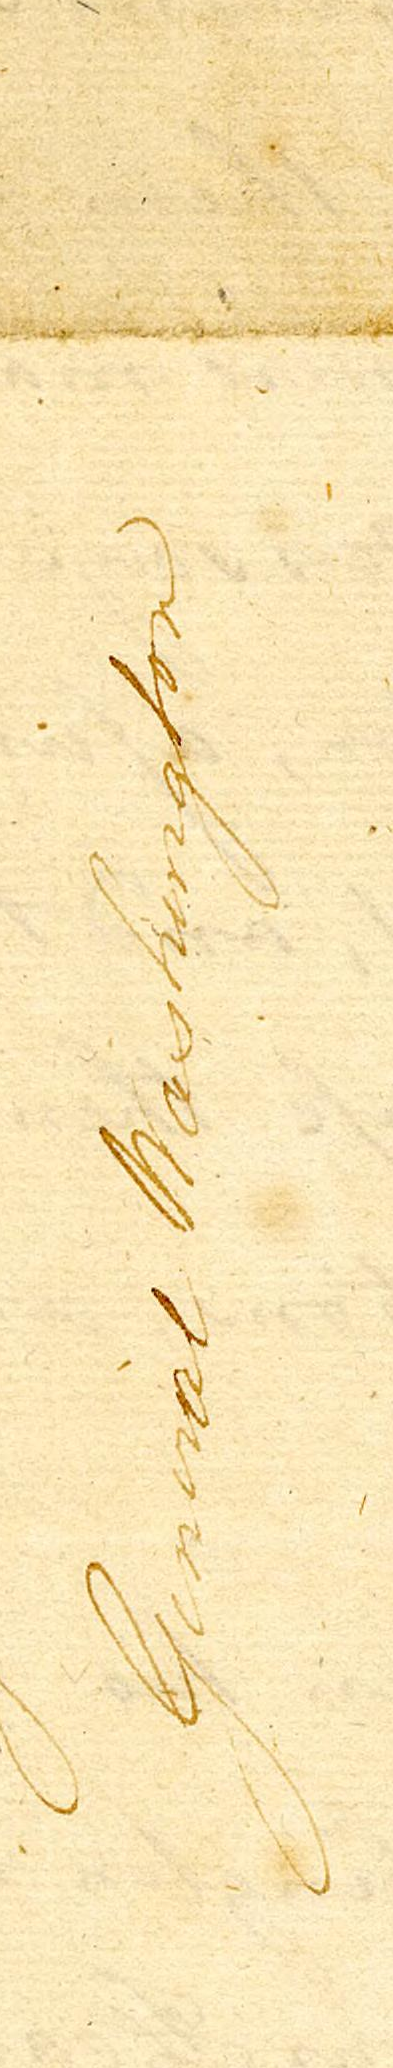General Washington
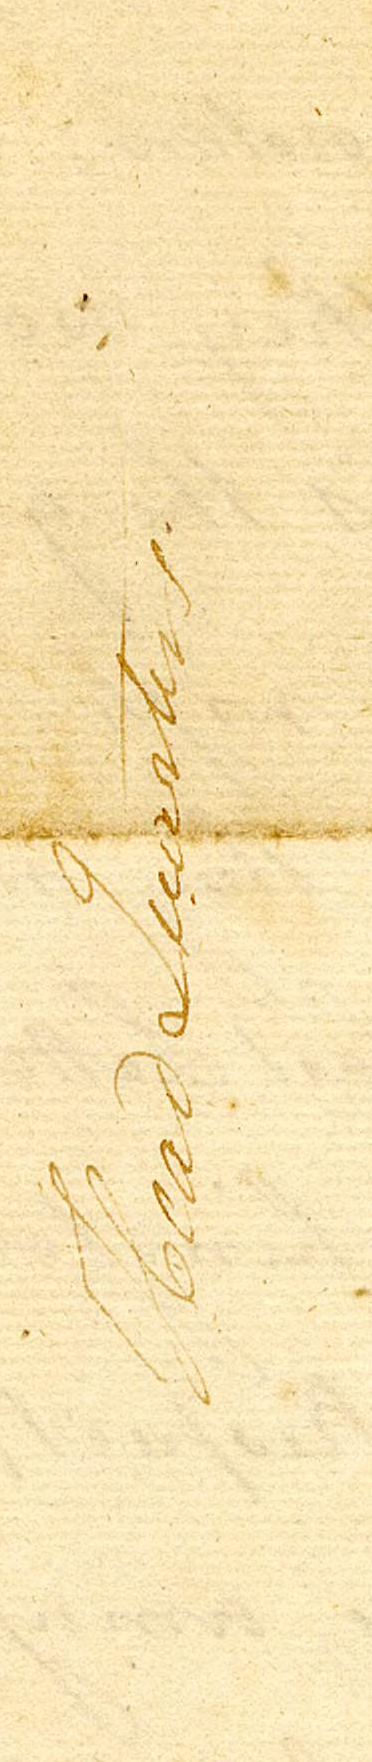Head Quarters
